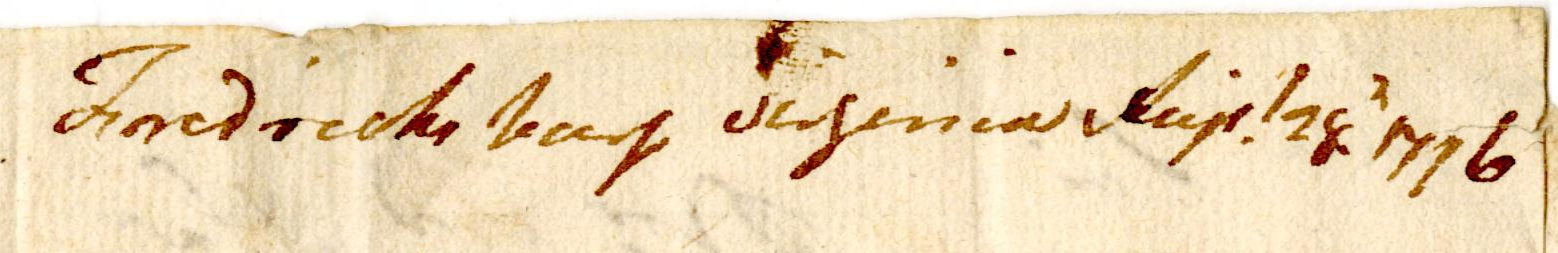Fredrichsburg Virginia Sept^r 28^th 1776
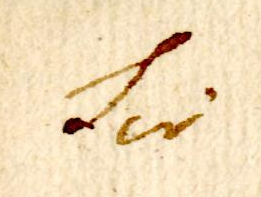Sir
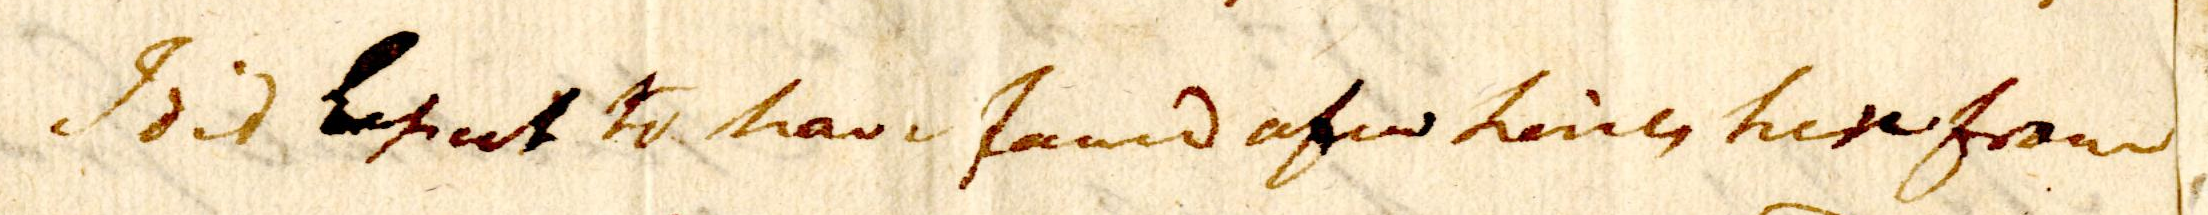I did Expect to have favord after being here from
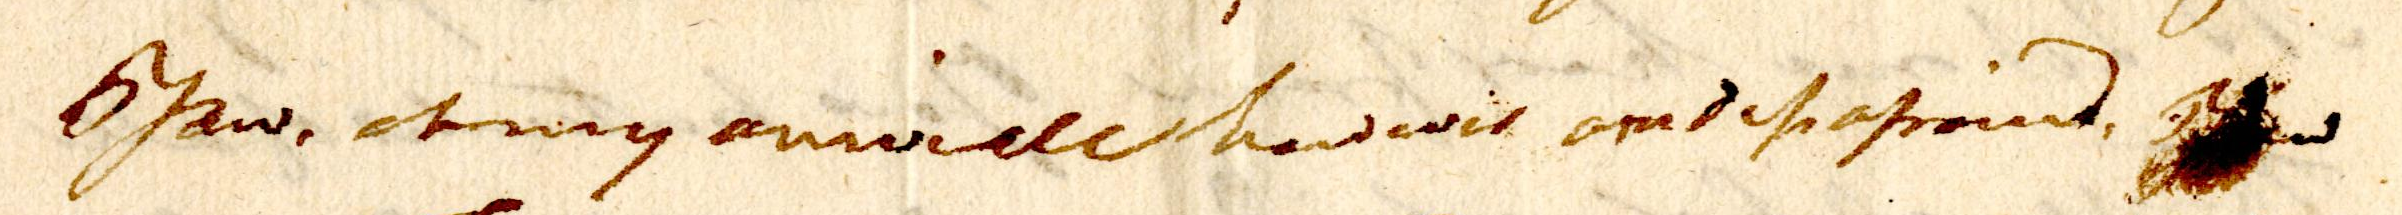you. as my answer however and papired you
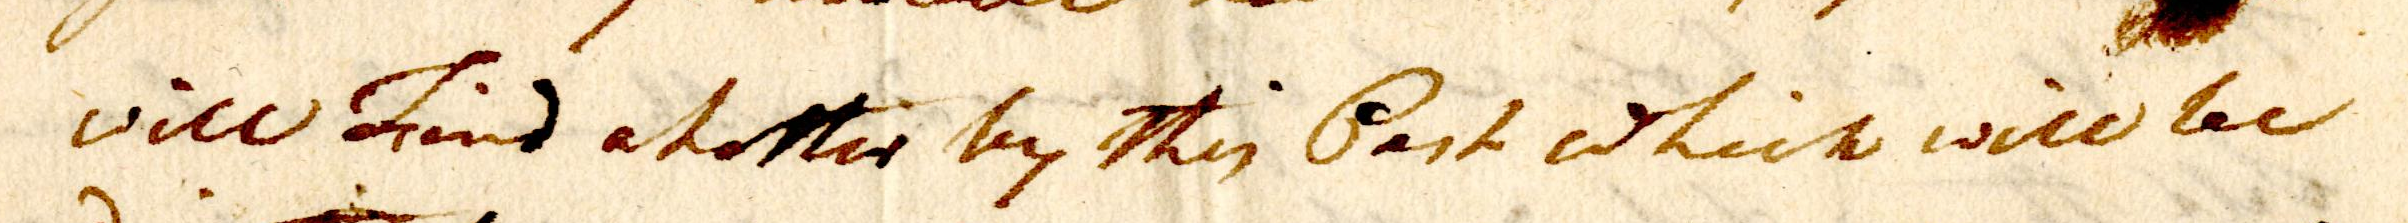will Find a letter by this Post which will be
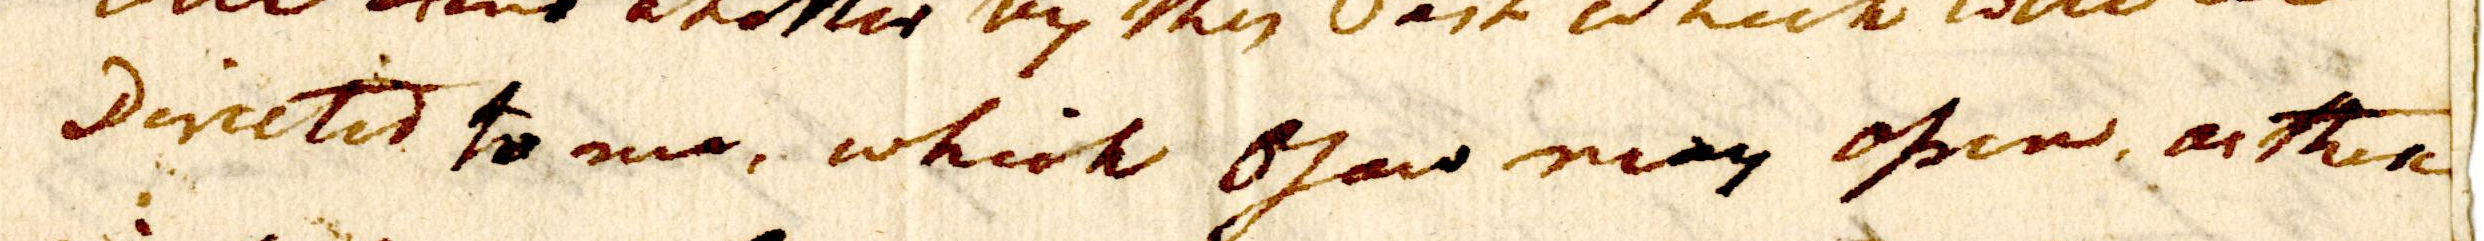directed to me, which you may open, as there
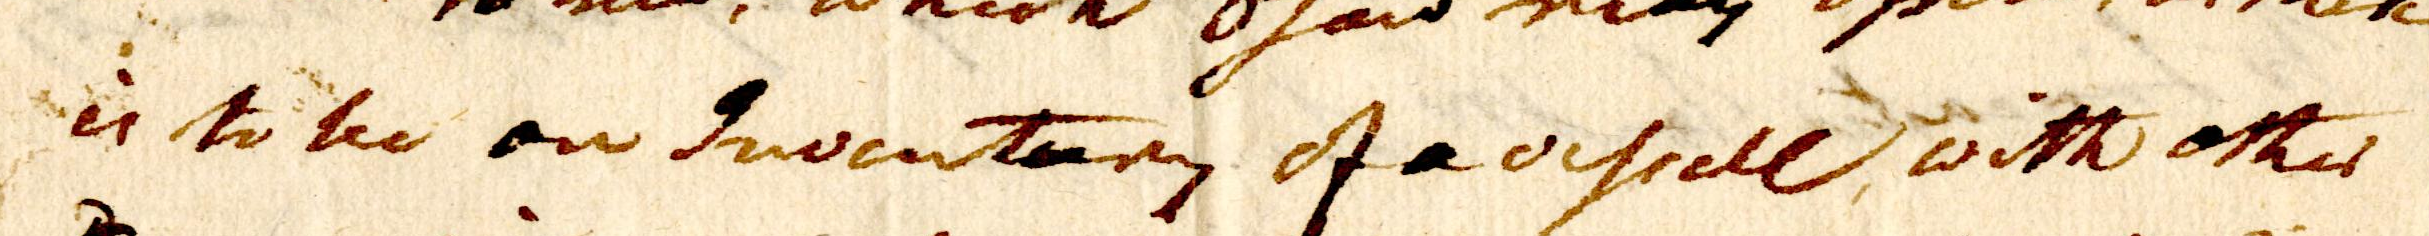is to be an Inventory of a vessell with other
